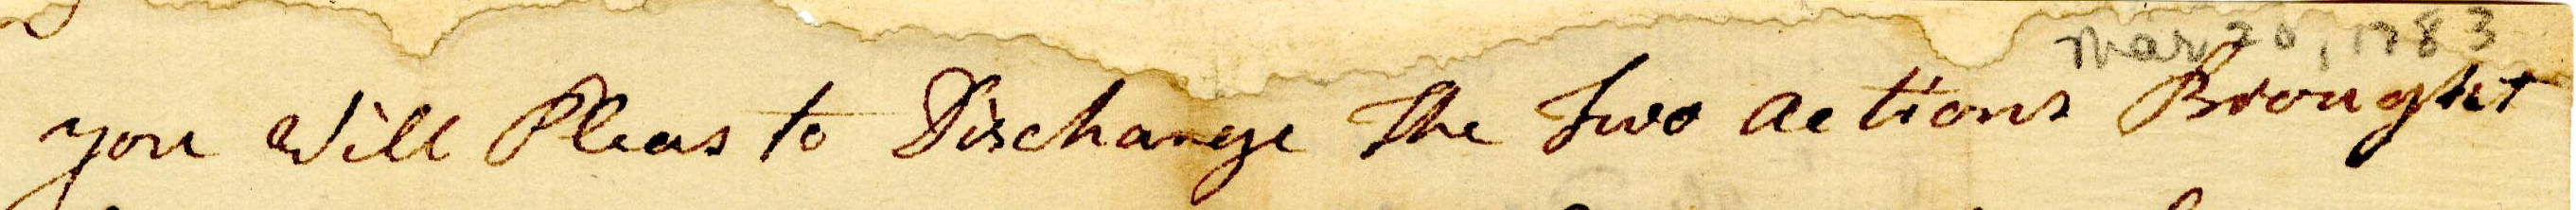you Will Pleas to Discharge The Two actions Brought
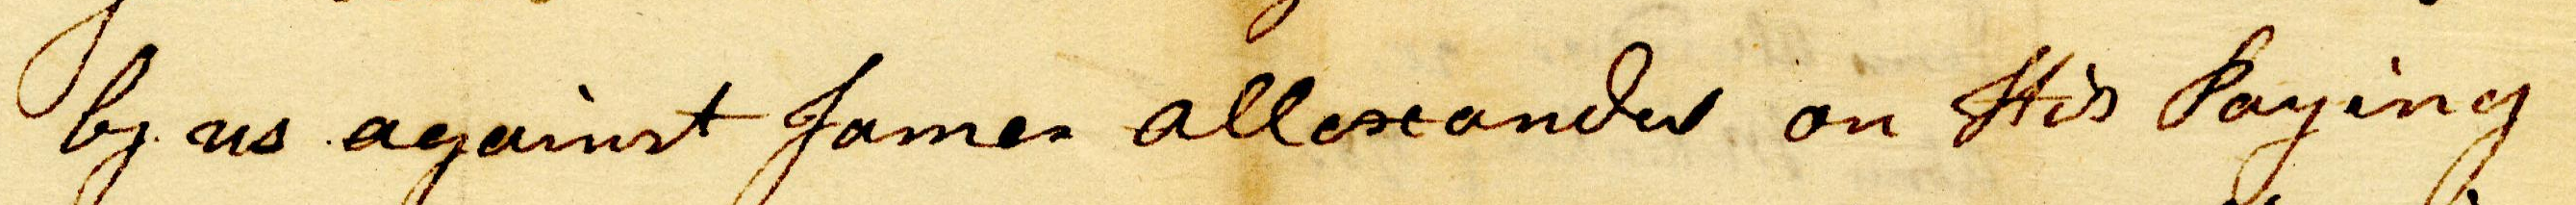by us against James Allexander on His Paying
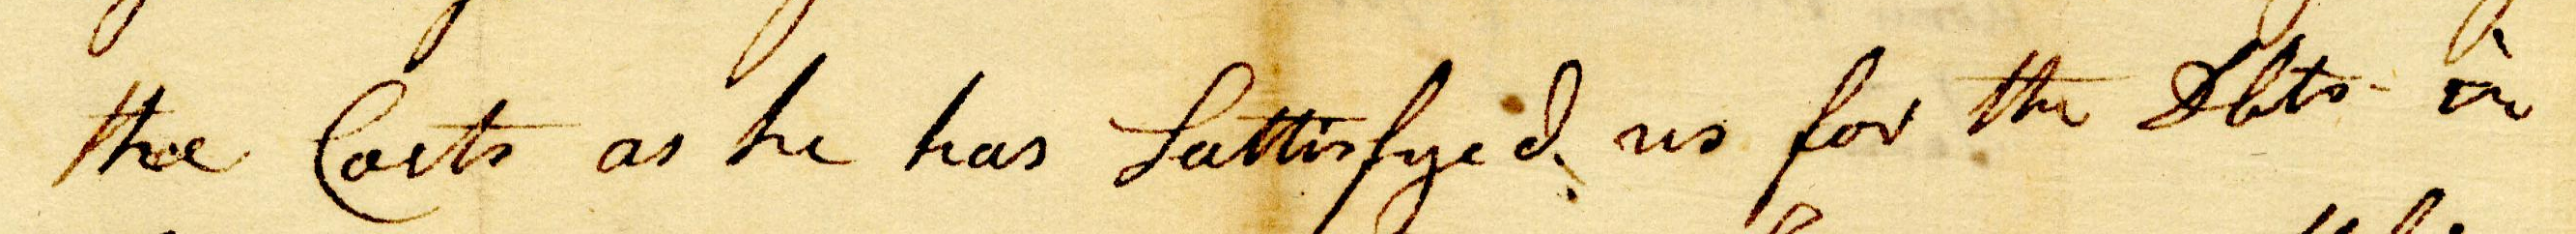the Costs as he has sattisfyed us for the Dbts in
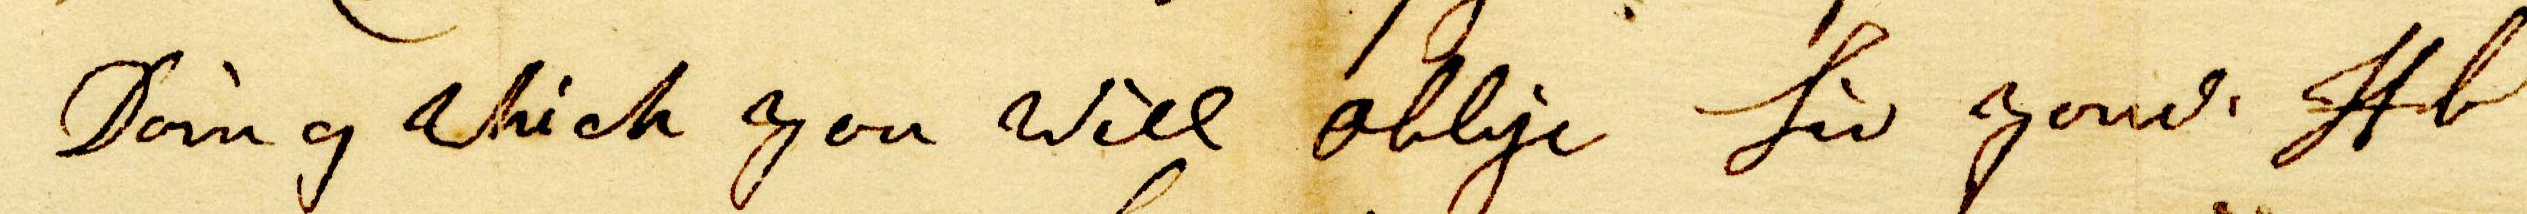Doing which you will oblige Sir youur Hble
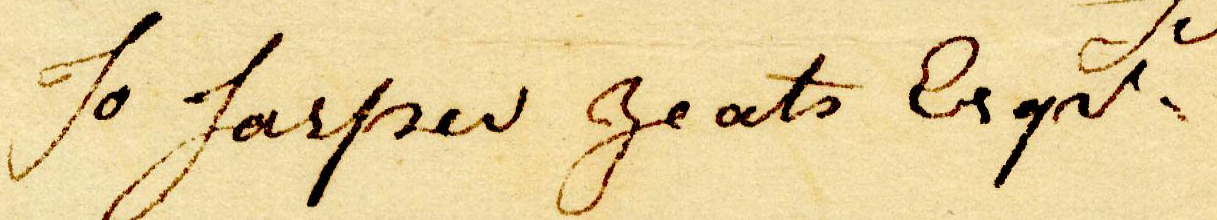To Jasper Yeats Esq^r.
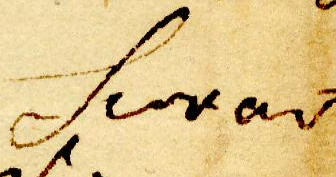Servant
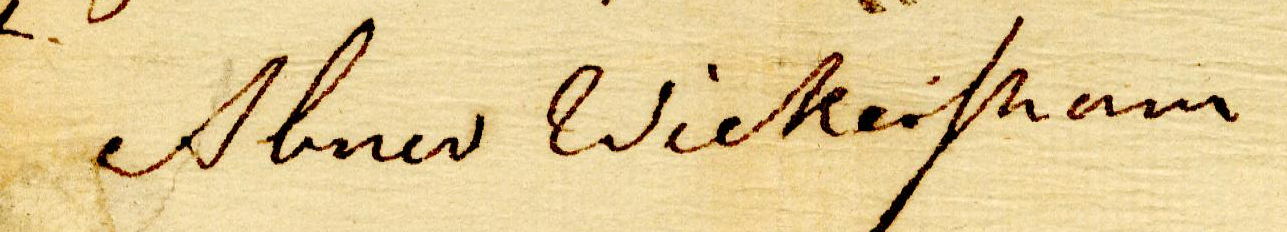Abner Wickesham
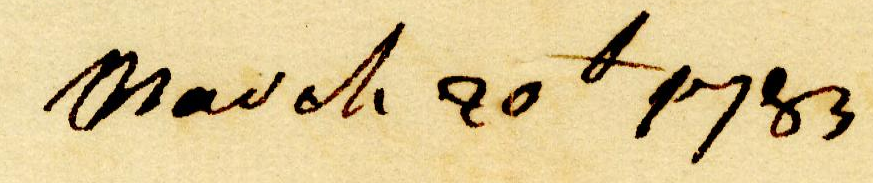March 20^th 1783
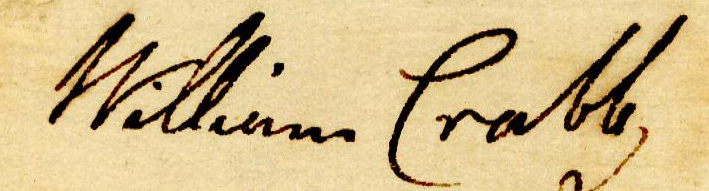William Crabb
